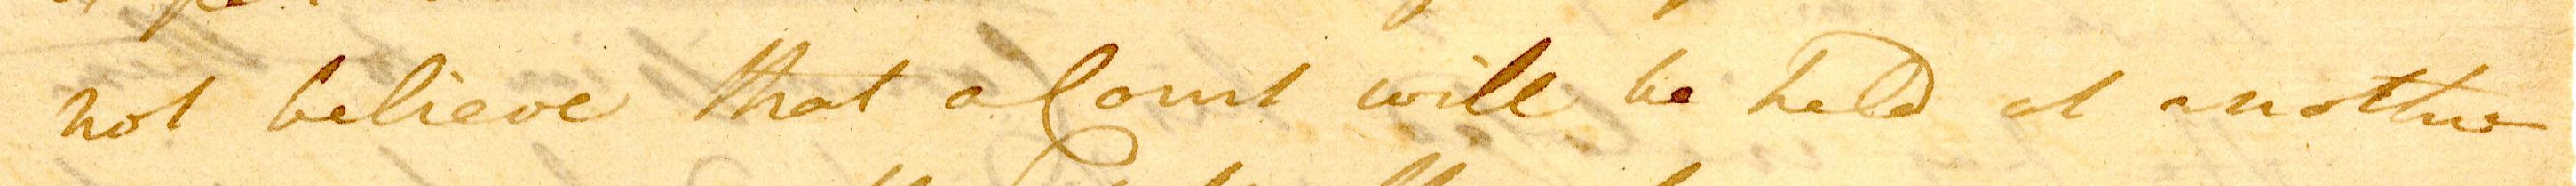not believe that a Court will be held at another
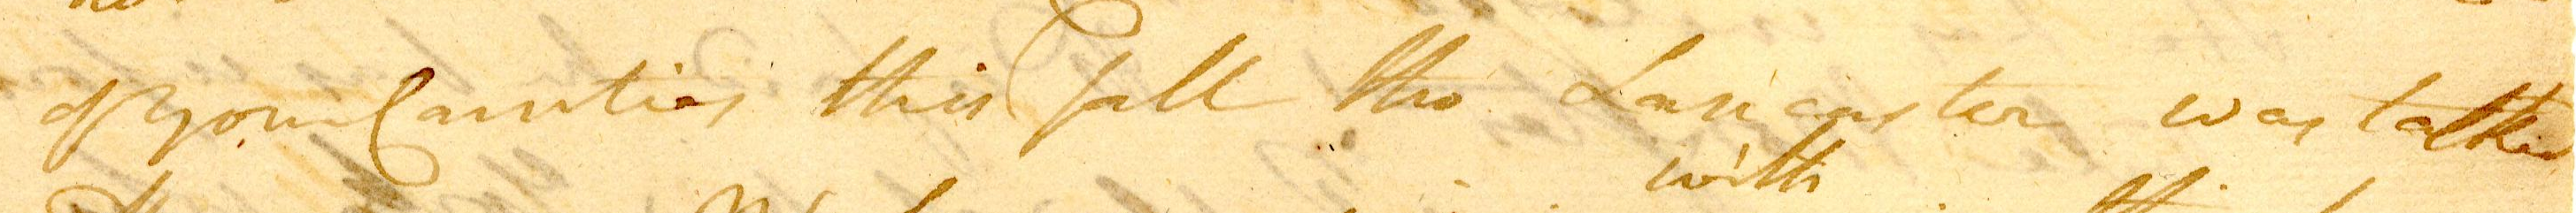of your Counties this fall tho Lacaster was talked
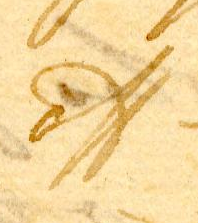off.
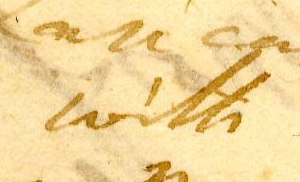with
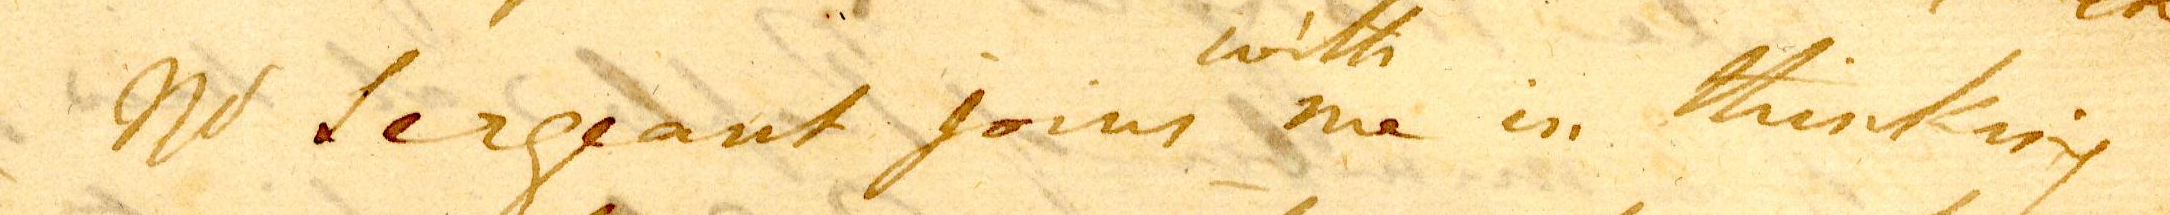No Sergeant joins ^ me in thinking
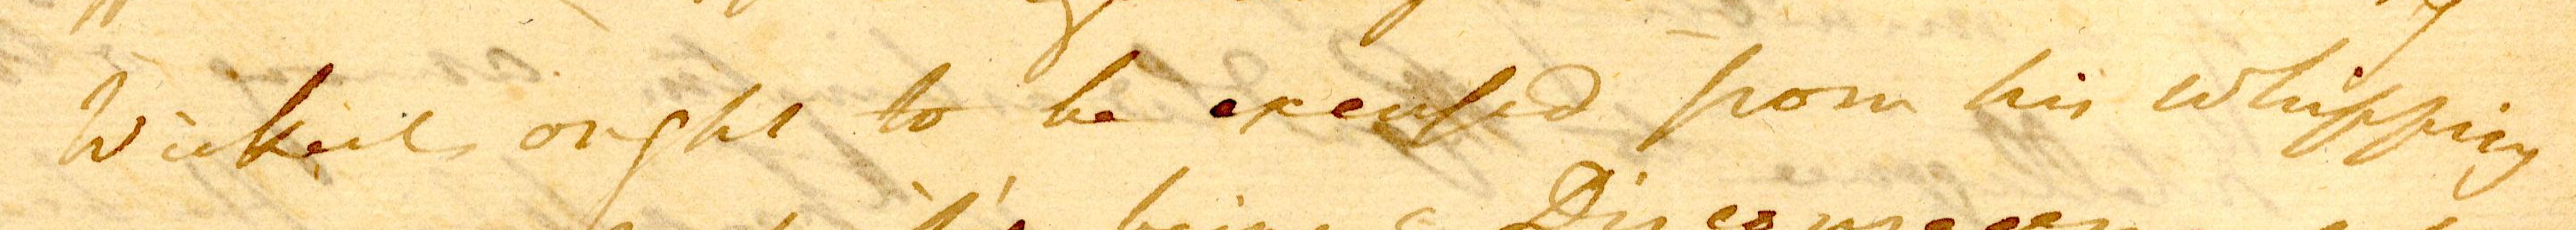Wickerts ought to be excused from his whipping
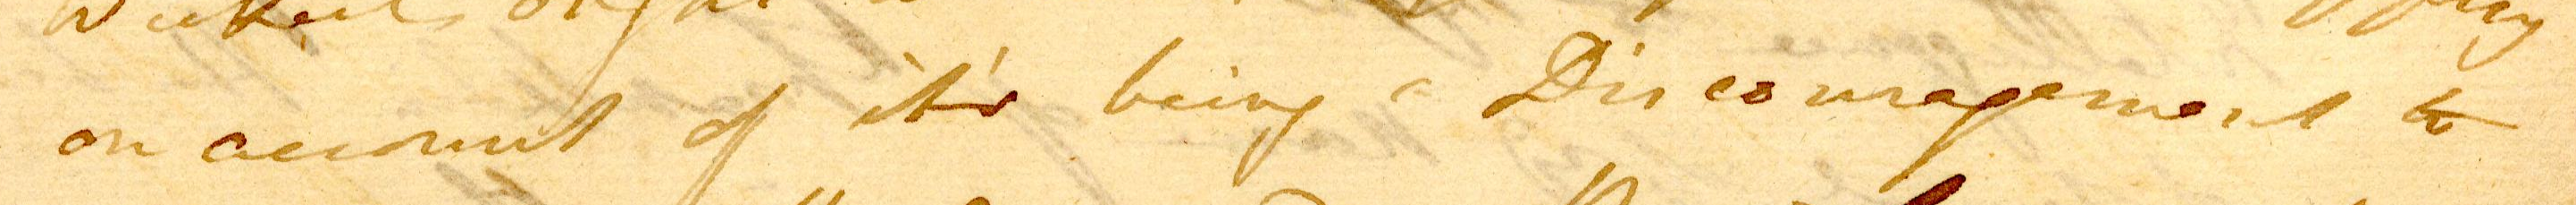on account of it's being Discouragement to
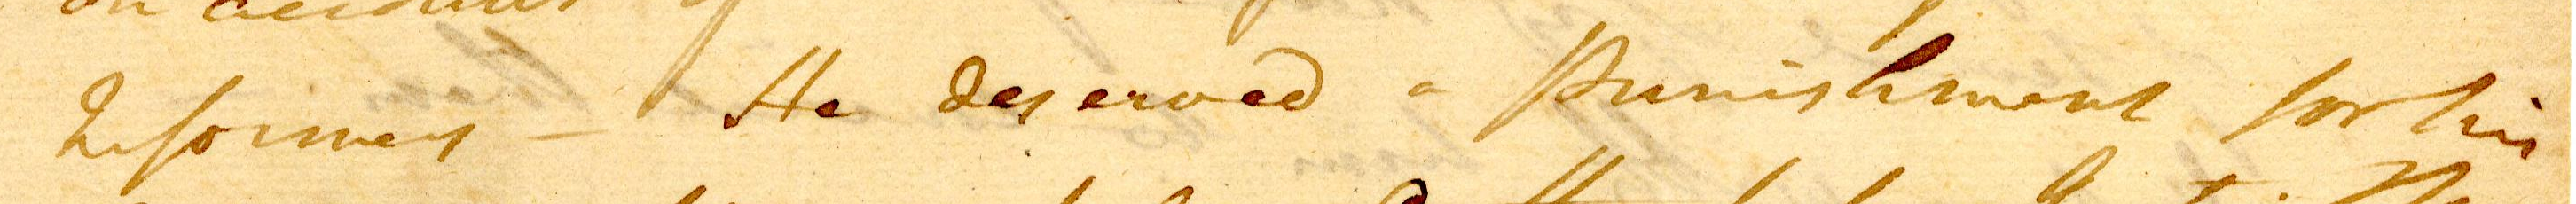Reformes. He deserved Punishment for his
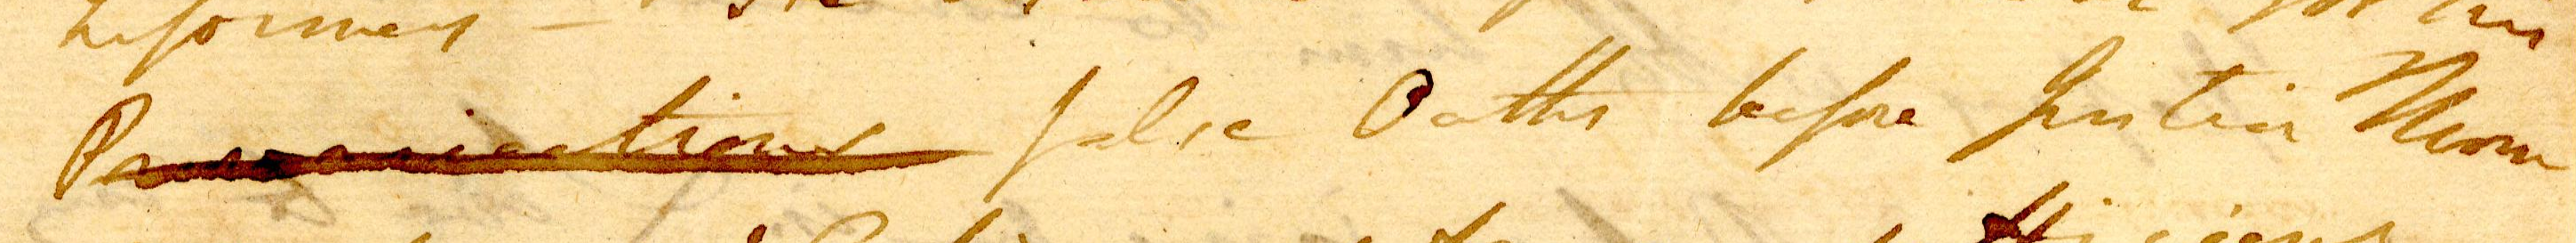[Prevarications] false Oaths before Justice Men
